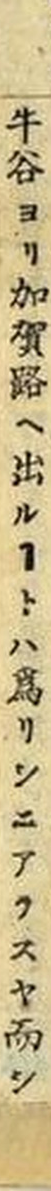牛谷ヨリ加賀路へ出ルヿトハ爲リシニアラスヤ而シ
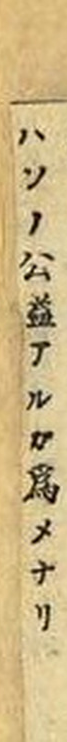ハソノ公益アルガ爲メナリ

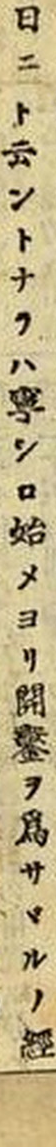ト云ントナラハ寧シロ始メヨリ開鑿ヲ爲サヾルノ經
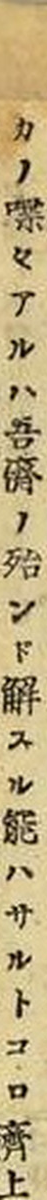カノ噤々アルハ吾儕ノ殆ンド解スル能ハサルトコロ
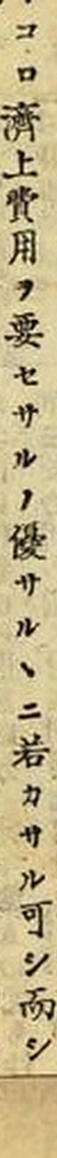濟上費用ヲ要セサルノ優サルヽニ若カサル可シ而シ
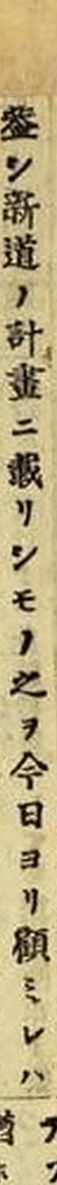蓋シ新道ノ計畫ニ載リシモノ之ヲ今日ヨリ顧ミレハ
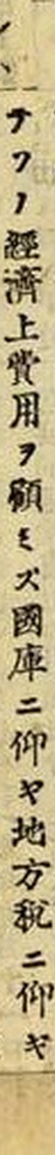テソノ經濟上費用ヲ顧ミズ國庫ニ仰ギ地方税ニ仰ギ
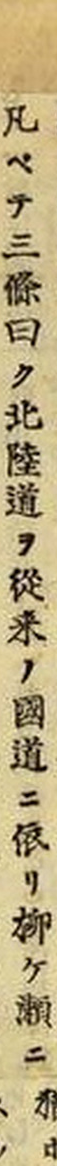凡ベテ三條曰ク北陸道ヲ從来ノ國道ニ依リ柳ケ瀬ニ
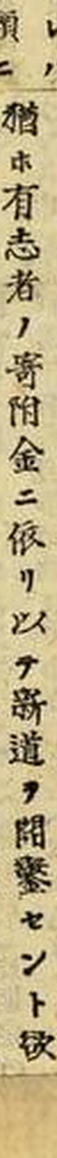猶ホ有志者ノ寄附金ニ依リ以テ新道ヲ開鑿セント欲
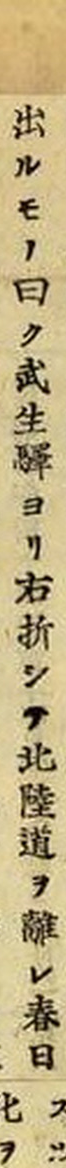出ルモノ曰ク武生驛ヨリ右折シテ北陸道ヲ離レ春日
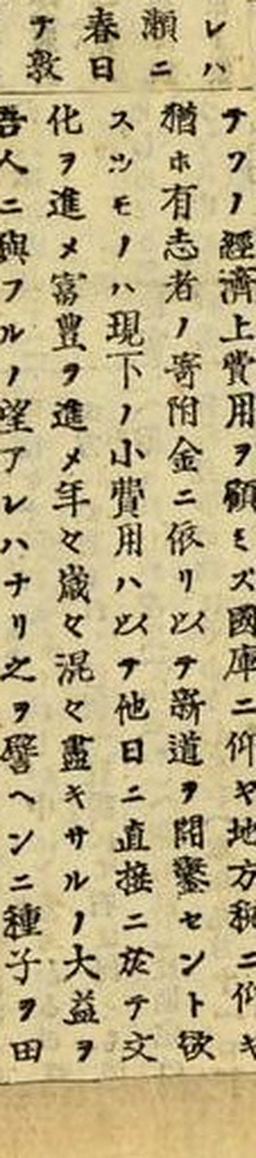スルモノハ現下ノ小費用ハ以テ他日ニ直接ニ於テ文
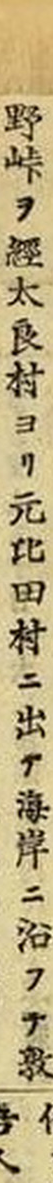野峠ヲ經太良村ヨリ元比田村ニ出テ海岸ニ沿フテ敦
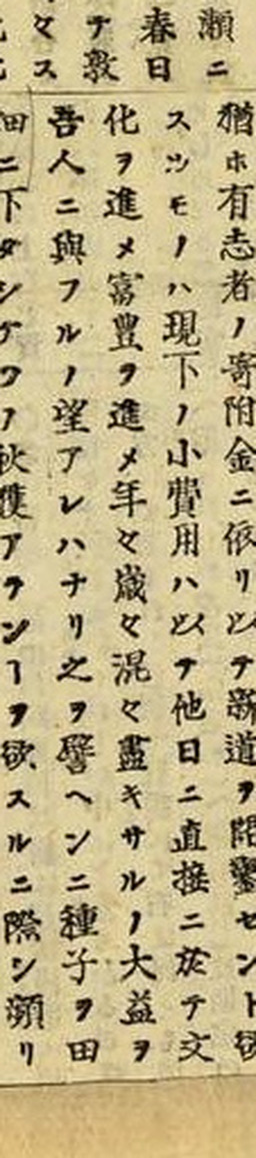化ヲ進メ富豊ヲ進メ年々歳々混々盡キサルノ大益ヲ
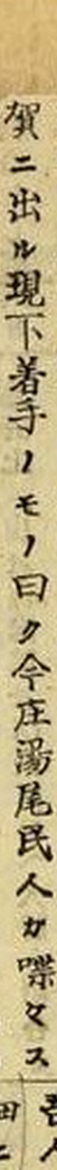賀ニ出ル現下着手ノモノ曰ク今庄湯尾民人ガ噤々ス
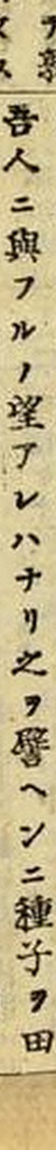吾人ニ與フルノ望アレハナリ之ヲ譬ヘンニ種子ヲ田
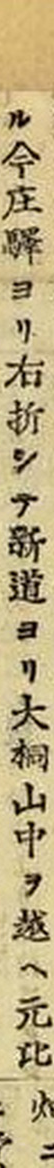ル今庄驛ヨリ右折シテ新道ヨリ大桐山中ヲ越ヘ元比
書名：温古集 五巻
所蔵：福井県文書館 Fukui Prefectural Archives
